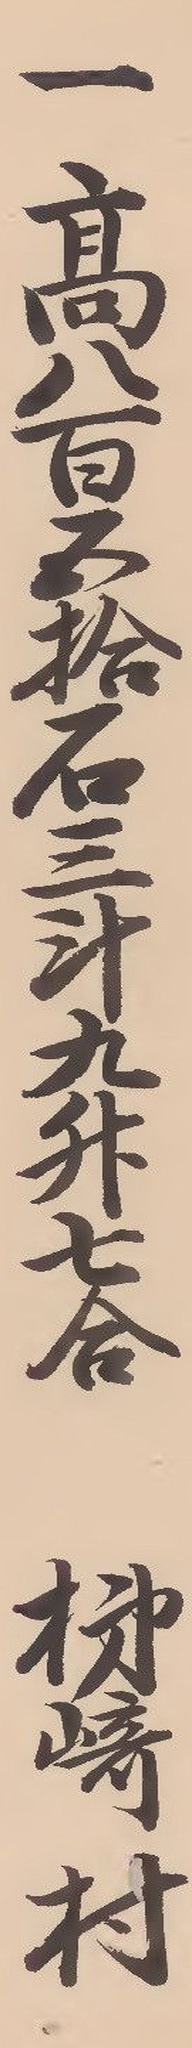一高八百五拾石三斗九升七合柿崎村
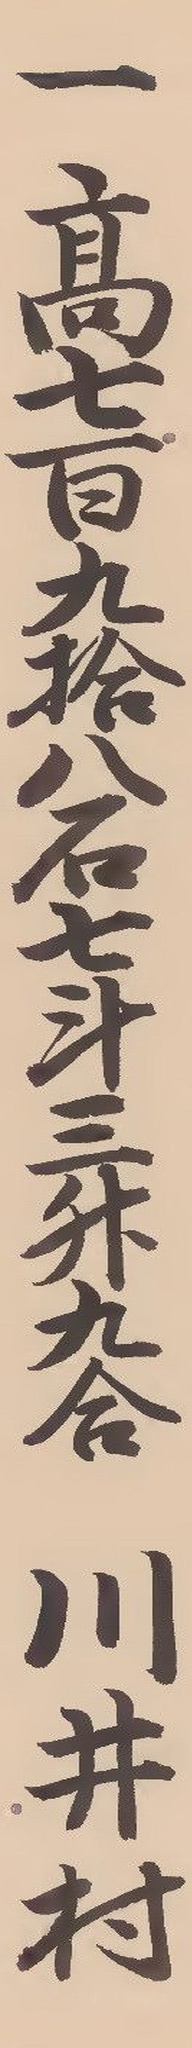一高七百九拾八石七斗三升九合川井村
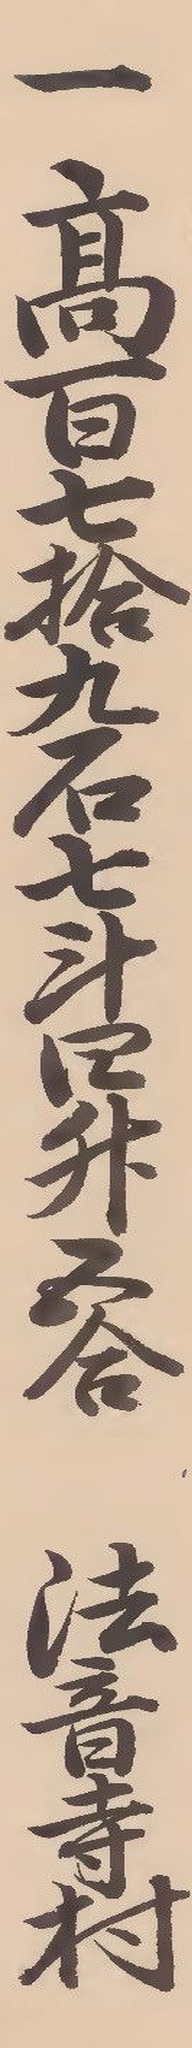一高百七拾九石七斗四升五合法音寺村
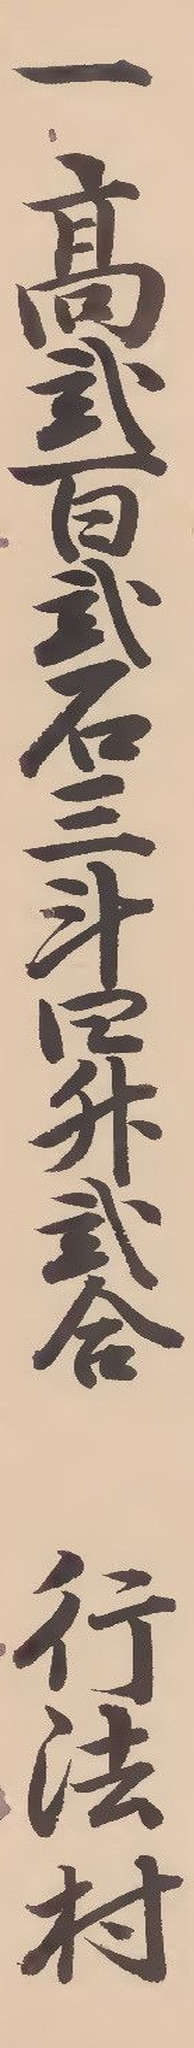一高弐百弐石三斗四升弐合行法村

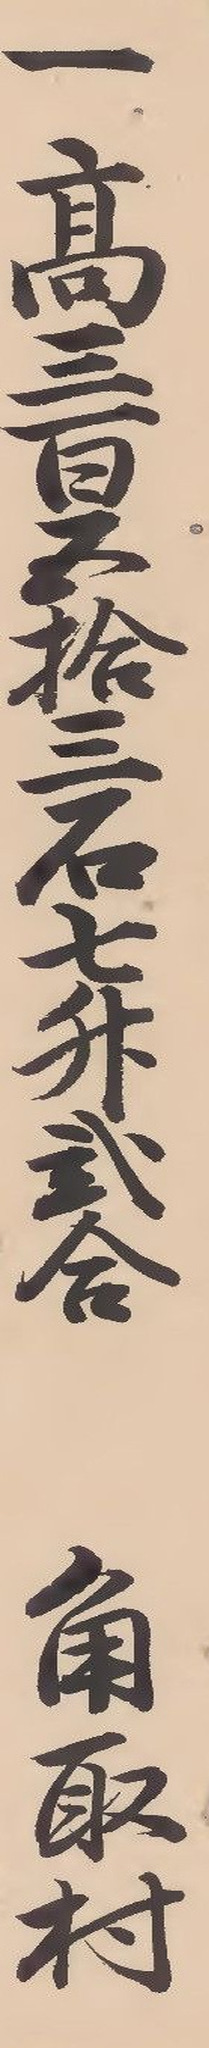一高三百五拾三石七升弐合角取村
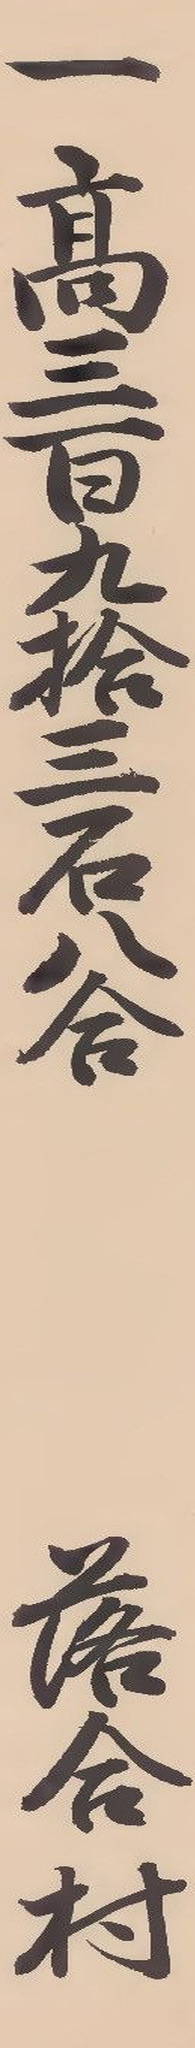一高三百九拾三石八合落合村
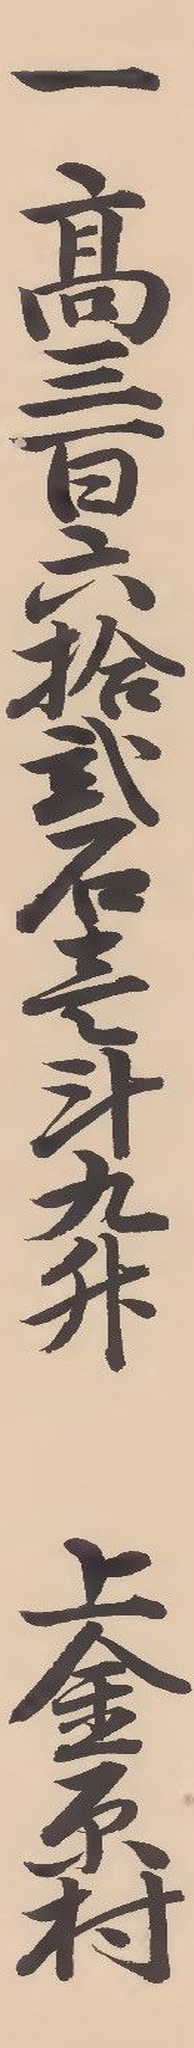一高三百六拾弐石壱斗九升上金原村
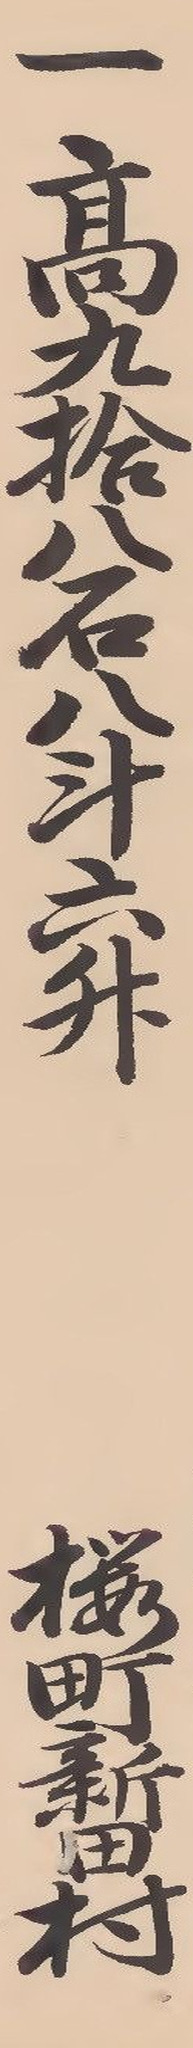一高九拾八石八斗六升桜町新田村
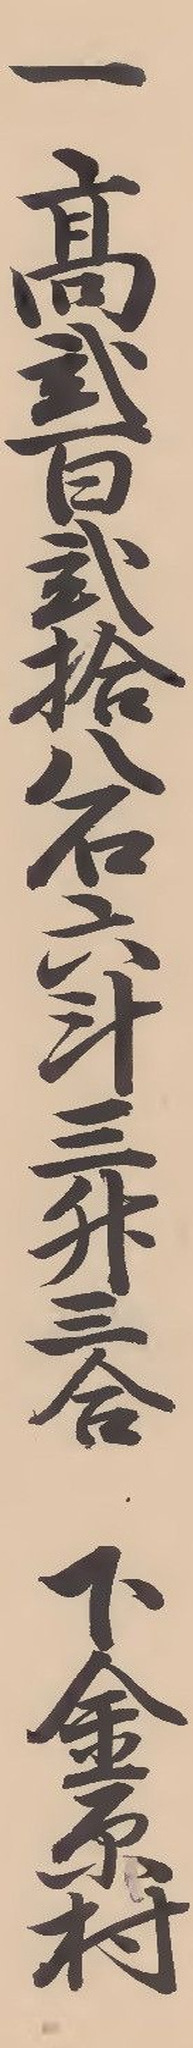一高弐百弐拾八石六斗三升三合下金原村
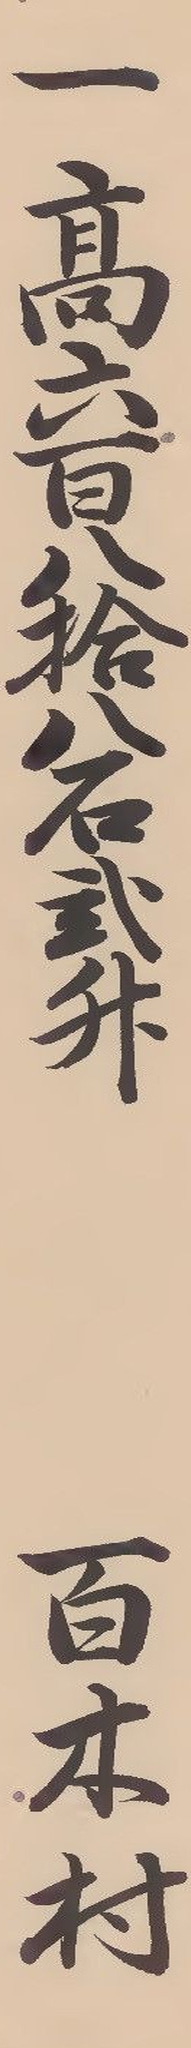一高六百八拾八石弐升百木村
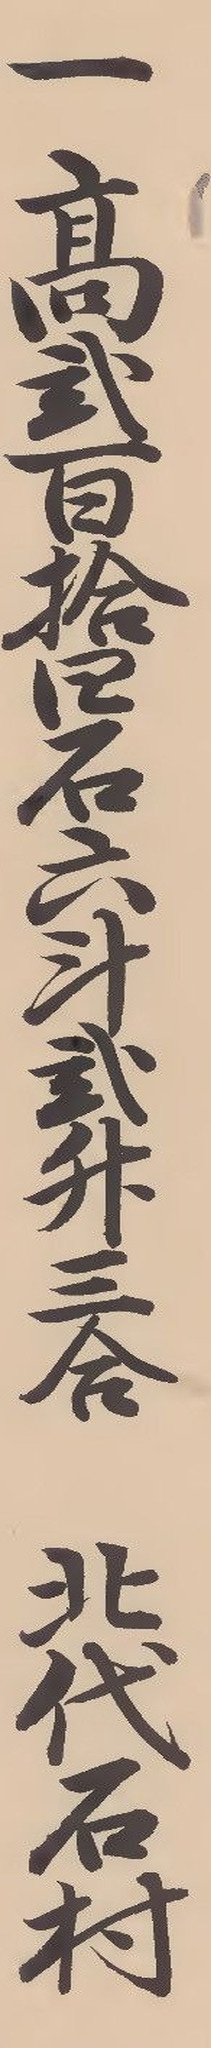一高弐百拾四石六斗弐升三合北代石村
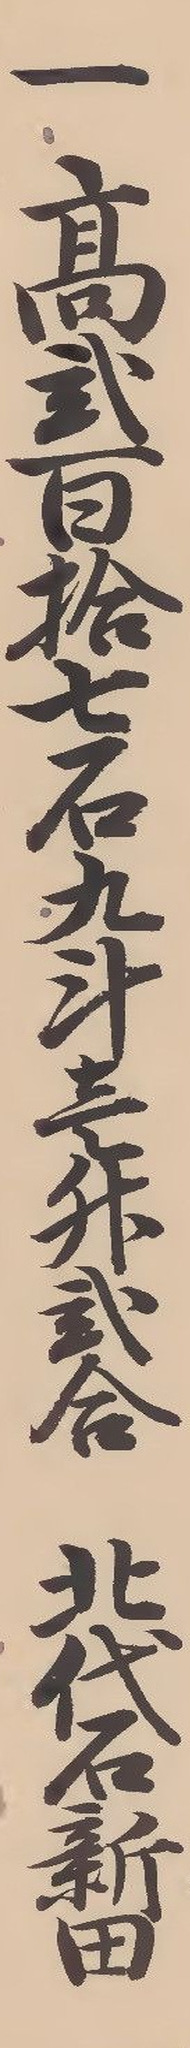一高弐壱百拾七石九斗壱升弐合北代石新田

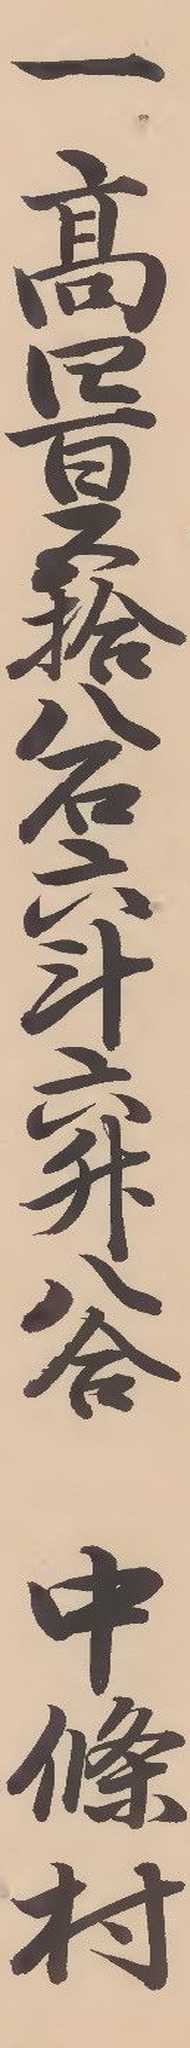一高四百五拾八石六斗六升八合中条村
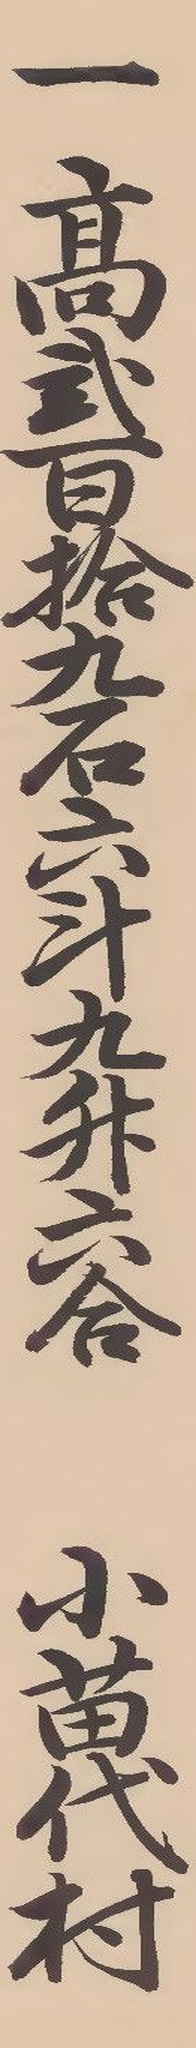一高弐百拾九石六斗九升六合小苗代村
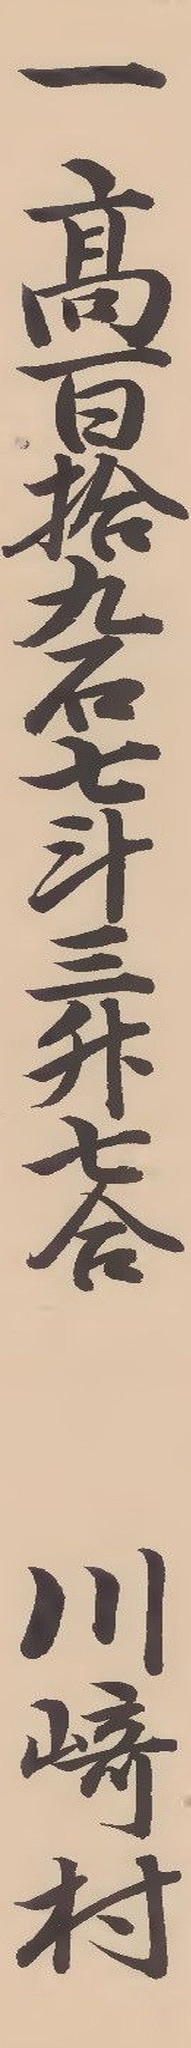一高百拾九石七斗三升七合川崎村
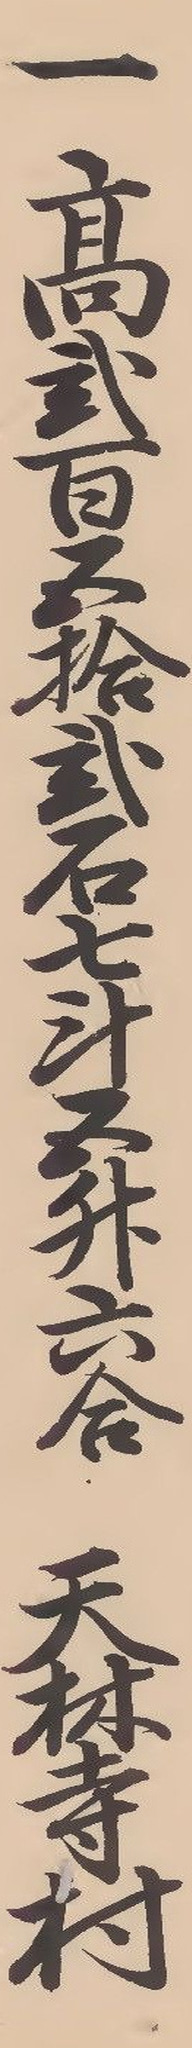一高弐百五拾弐石七斗五升六合天林寺村
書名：越後国郷帳　上
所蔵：国立公文書館 National Archives of Japan
